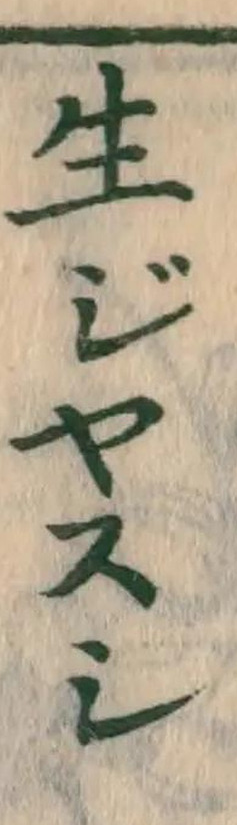生ジヤスシ
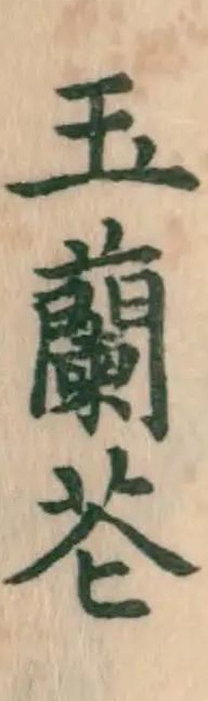玉蘭花

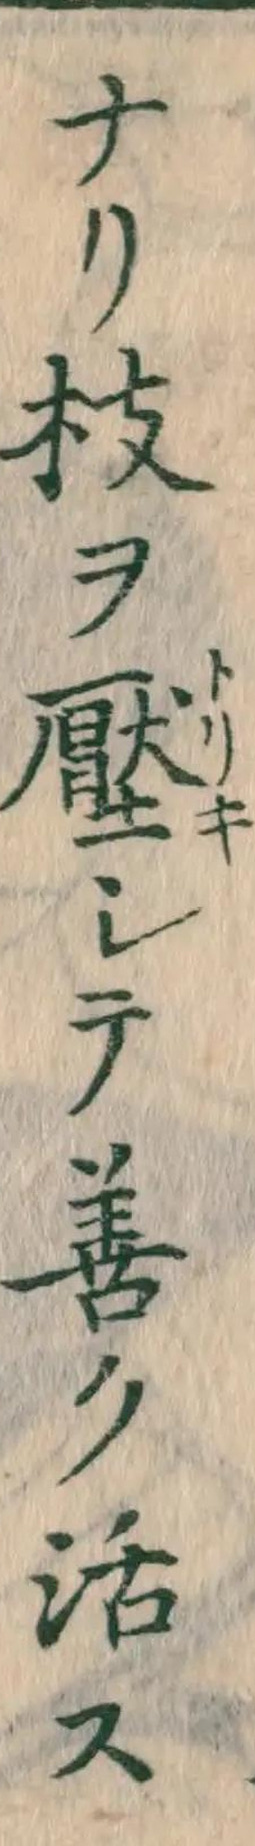ナリ枝ヲ圧シテ善ク活ス
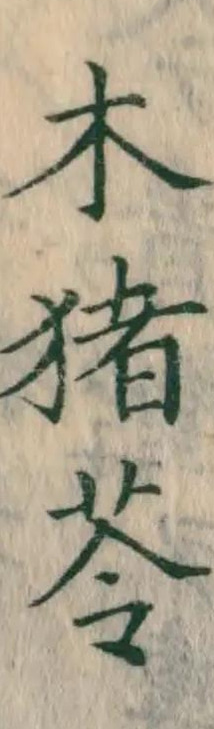木猪苓

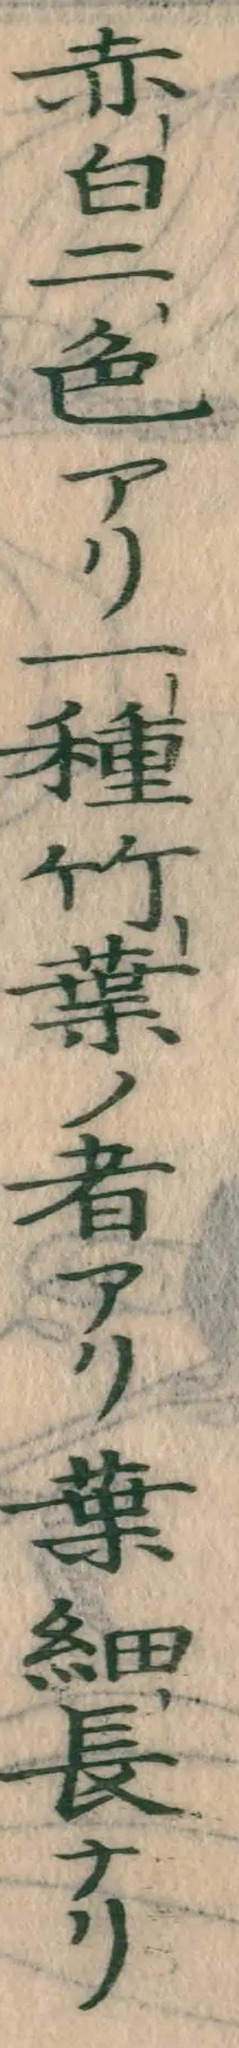赤-白二-色アリ一-種竹-葉ノ者アリ葉細-長ナリ
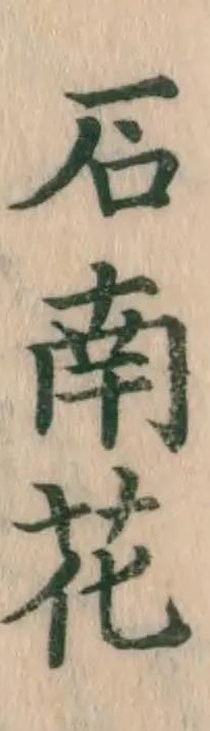石南花

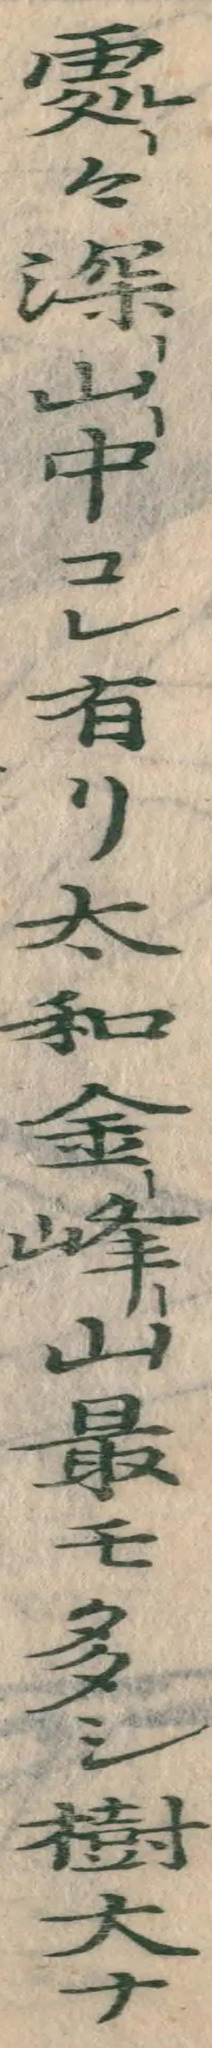処-々深-山-中コレ有リ太和金-峰-山最モ多シ樹大ナ
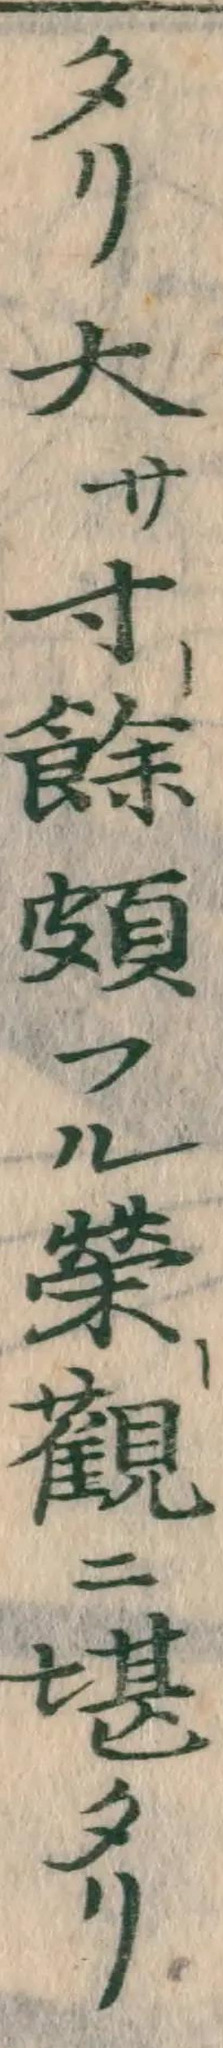タリ大寸-余頗フル栄-観ニ堪タリ
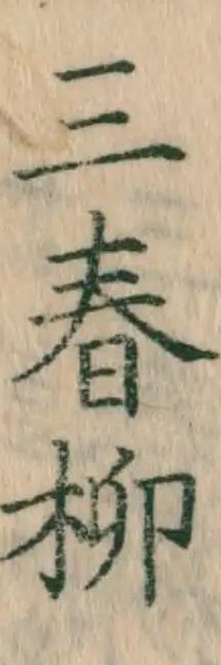三春柳

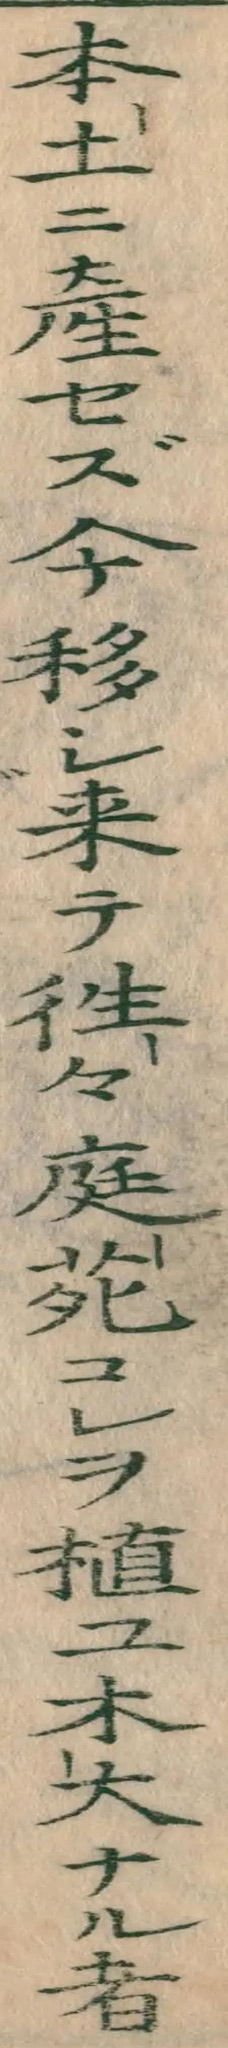本-土ニ産セズ今移シ来テ往-々庭-苑コレヲ植ユ木-大ナル者
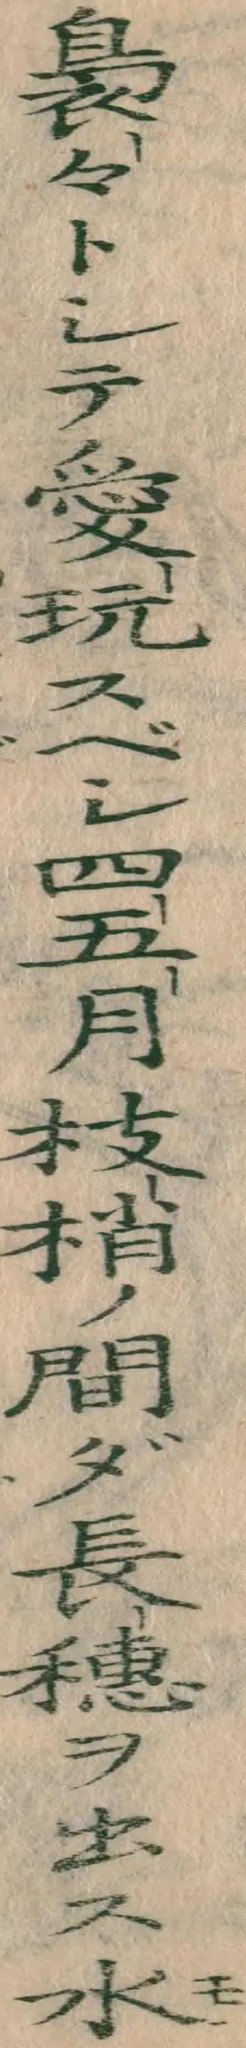裊-々トシテ愛-玩スベシ四-五-月枝-梢ノ間ダ長-穂ヲ出ス水
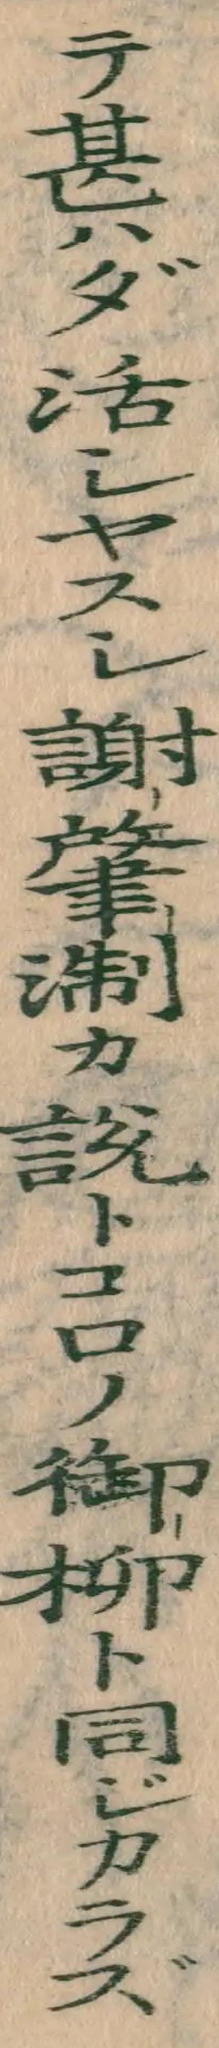テ甚ハダ活シヤスシ謝-肇-淛カ説トコロノ御-柳ト同ジカラズ
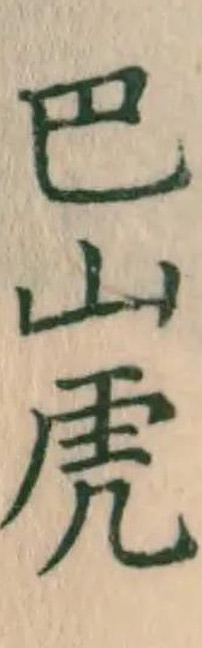巴山虎

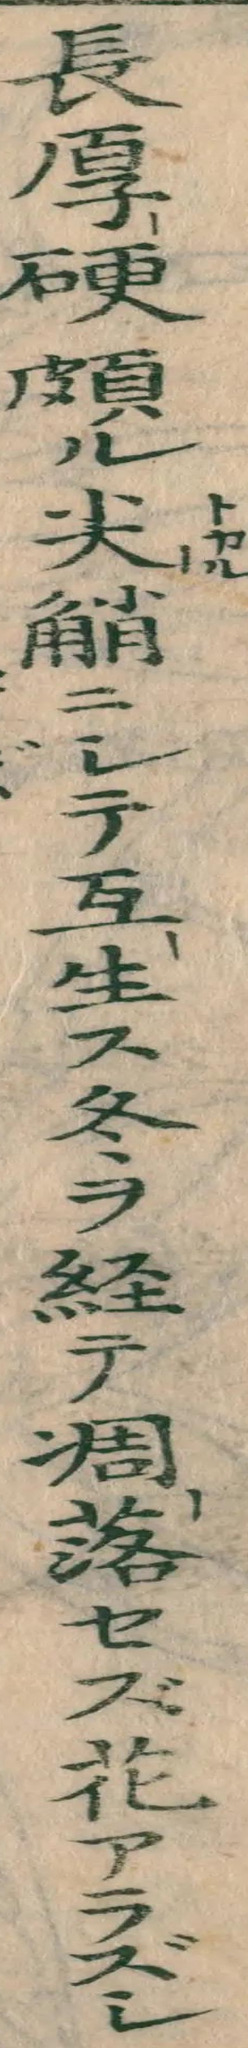長厚-硬頗ル尖-𧣪ニシテ互-生ス冬ヲ経テ凋-落セズ花アラズシ
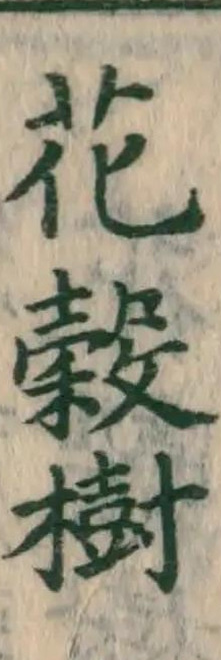花穀樹

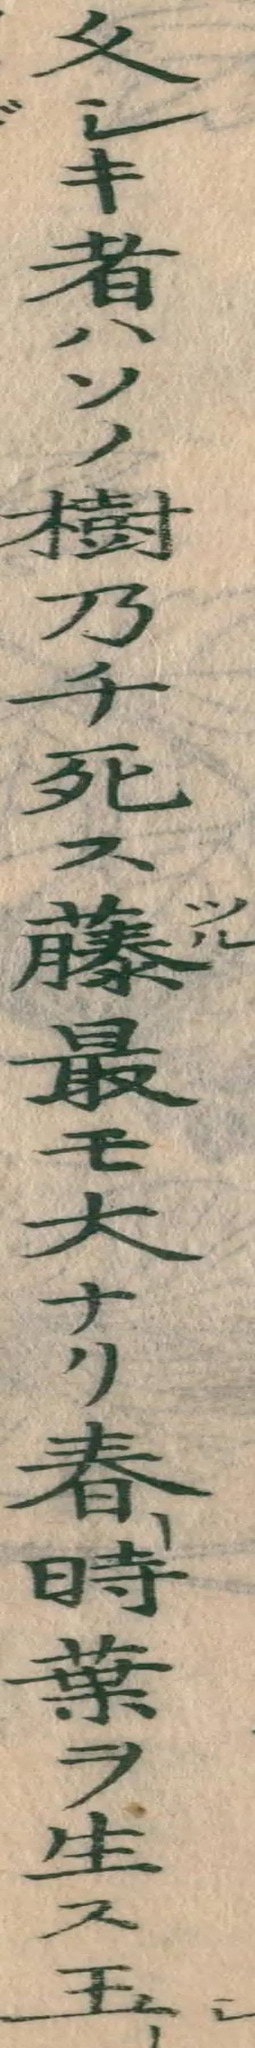久シキ者ハソノ樹乃チ死ス藤最モ大ナリ春-時葉ヲ生ス玉-
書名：花彙 草部4巻木部4巻. [2]
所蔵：国立国会図書館 National Diet Library, JAPAN
